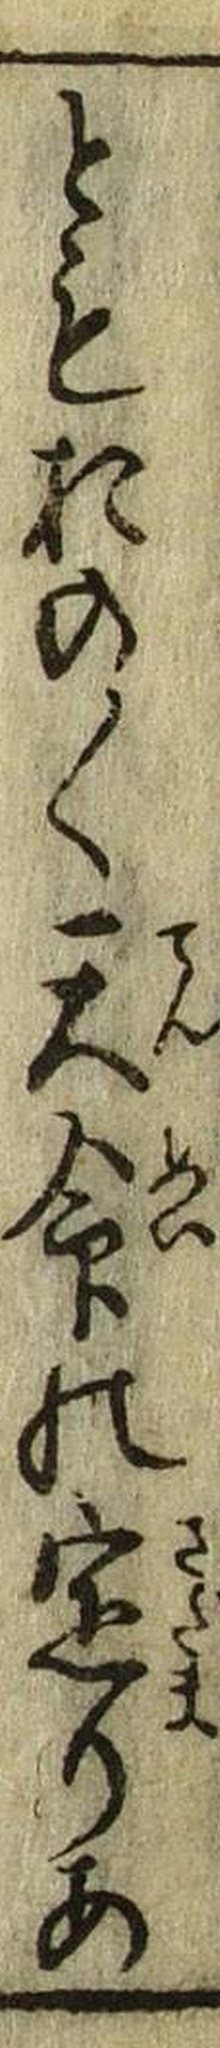ともおの〳〵天命の定りあ
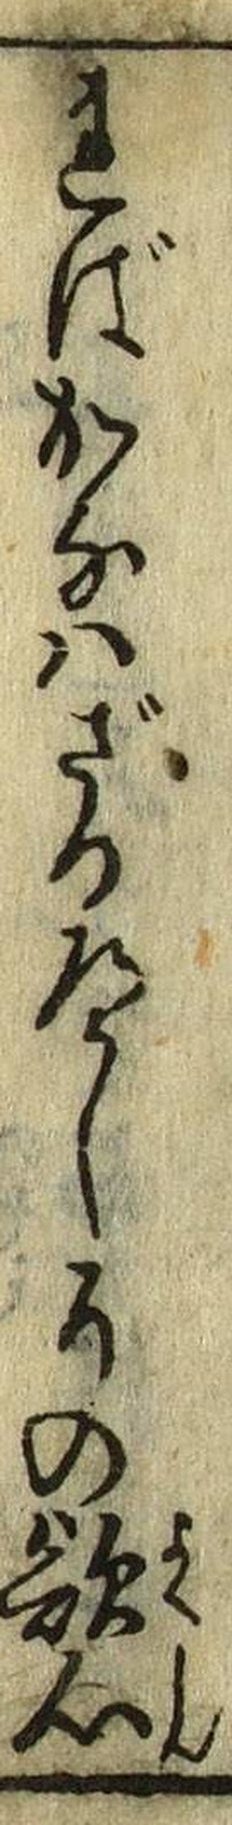ればかなはざるへしその欲心
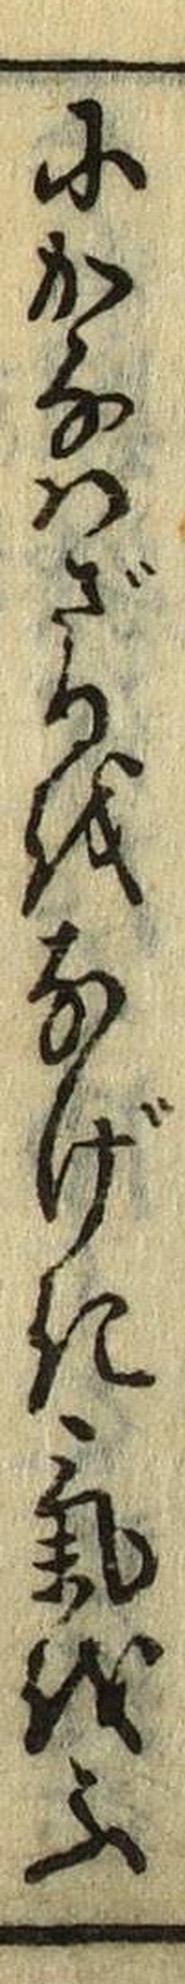にかなはざるをなげき気をふ
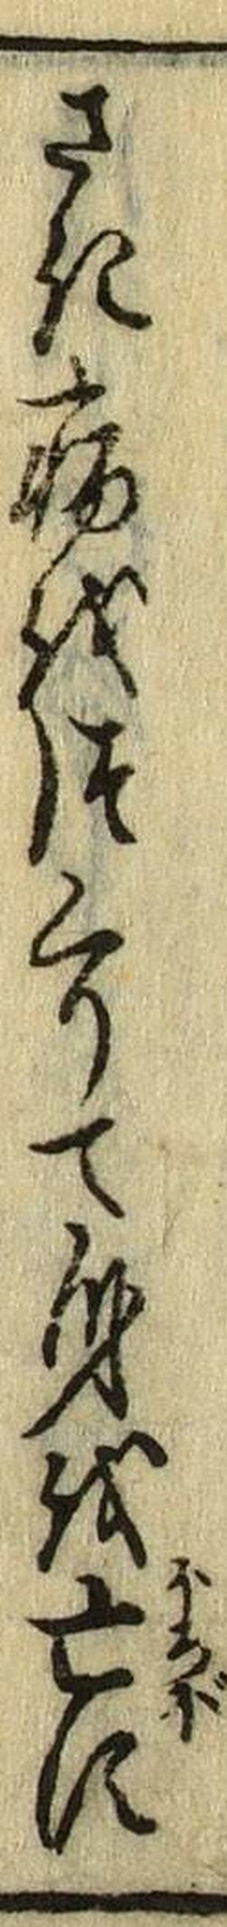さき病をつくりて身を亡す
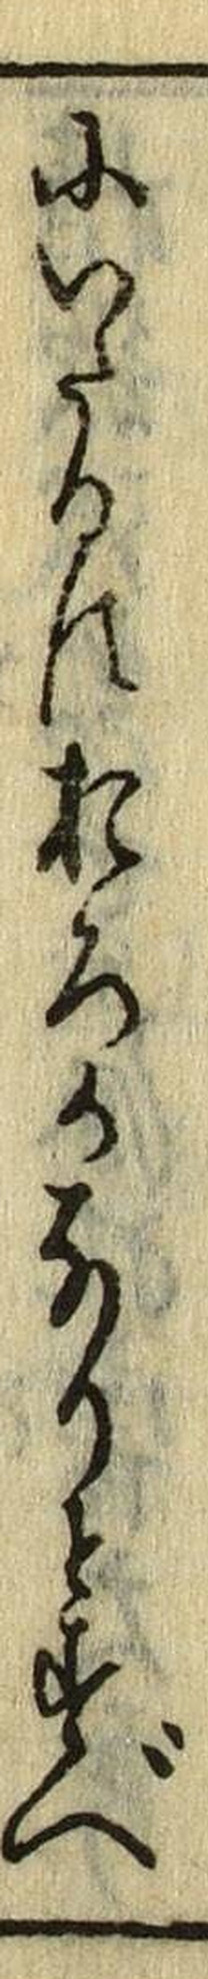にいたるはおろかなりとすべ
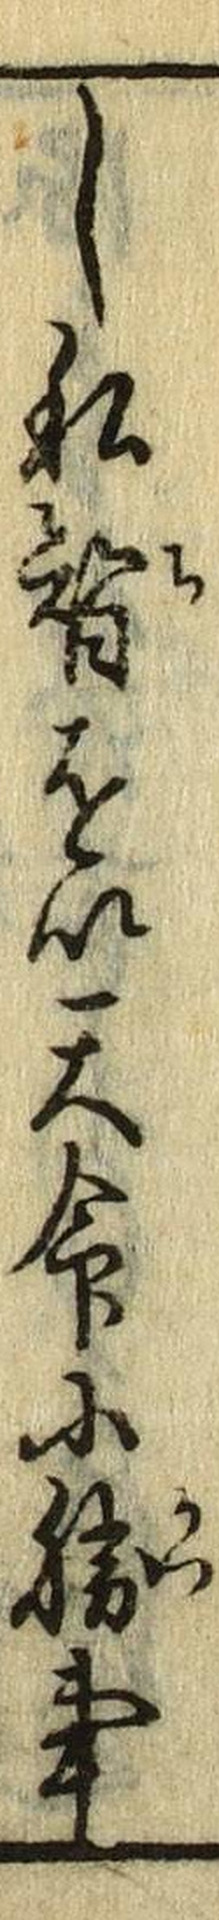し私智を以天命に勝事
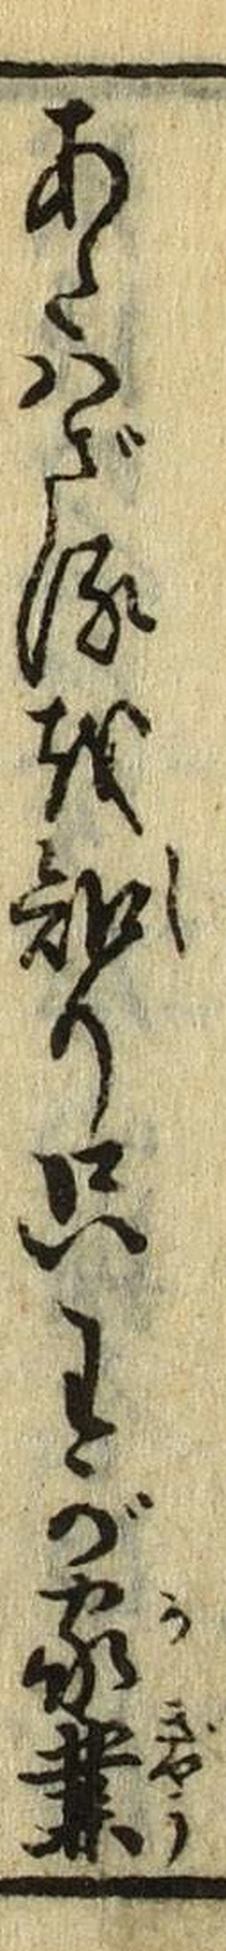あたはざるを知り只わが家業
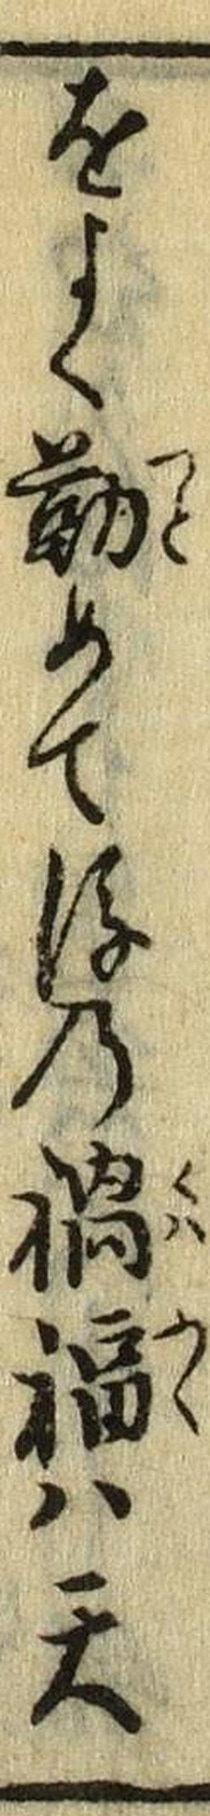をよく勤めて後の禍福は天
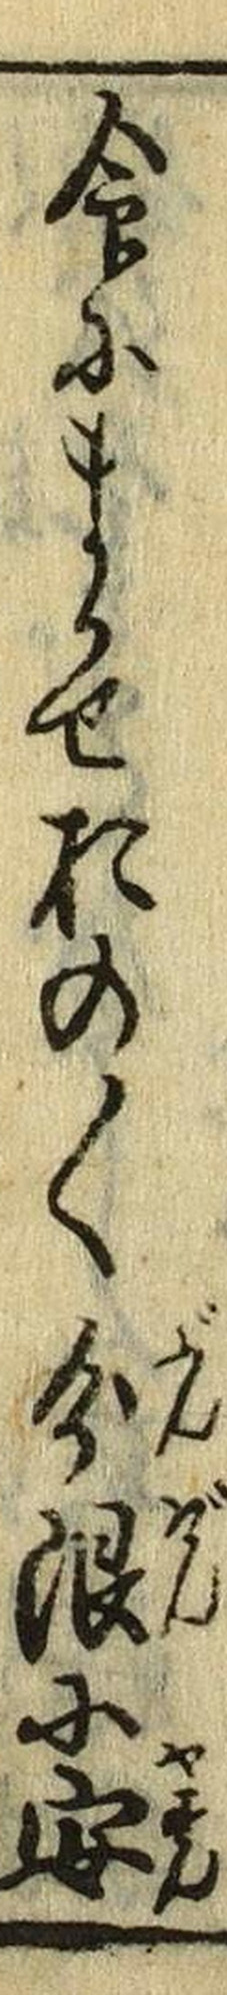命にまかせおの〳〵分限に安
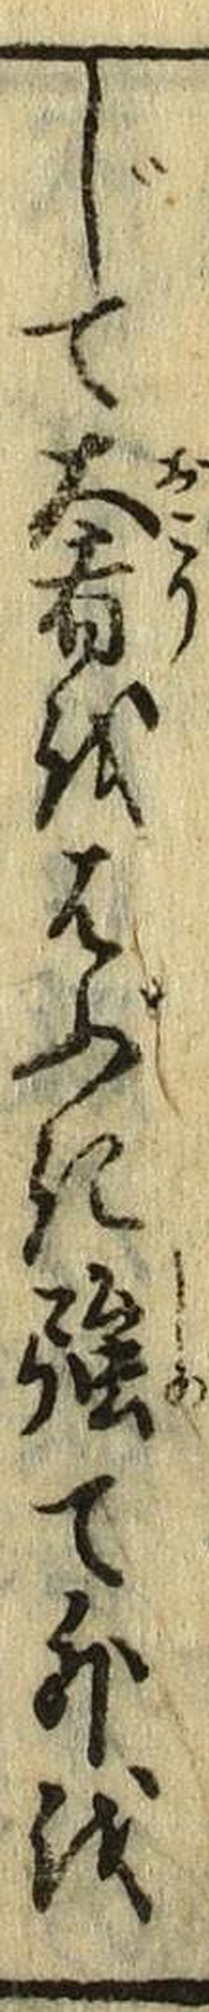じて奢をはぶき強て外を
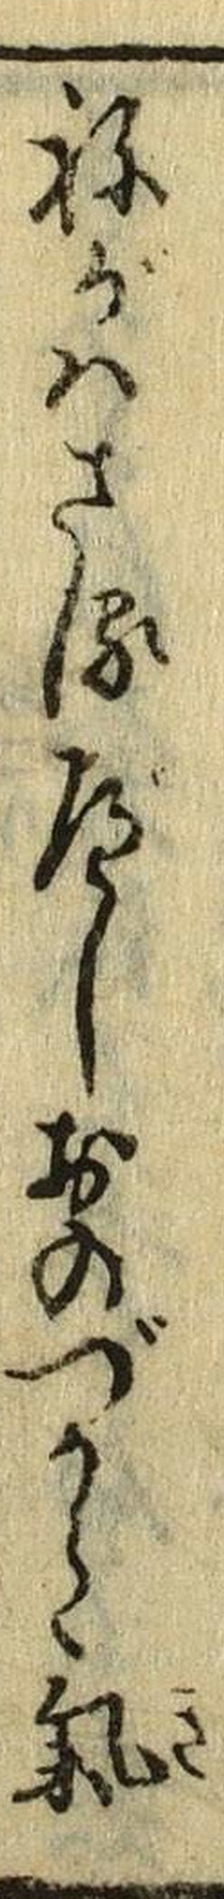ねがはさるべしおのづから気
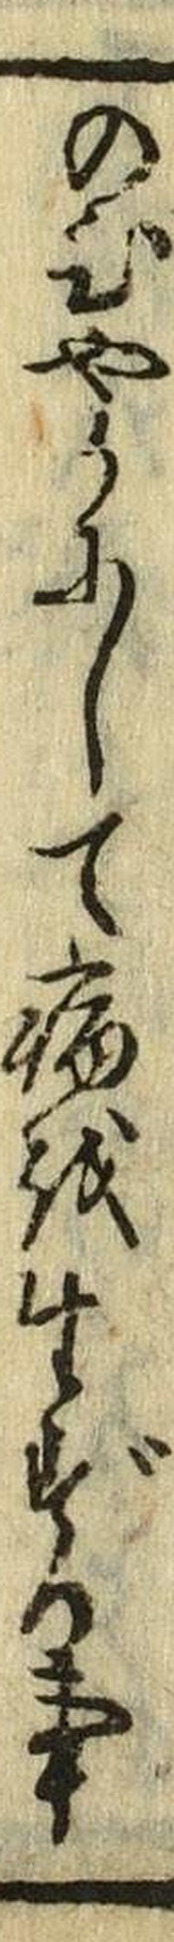のびやうにして病を生ずる事
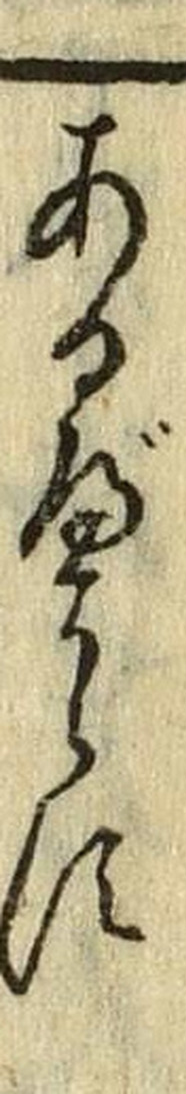あるべからす
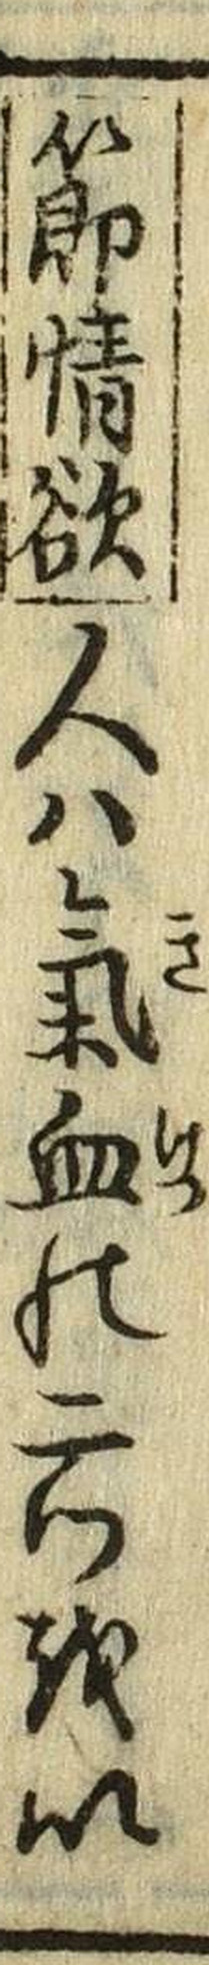節情欲人は気血の二ツを以
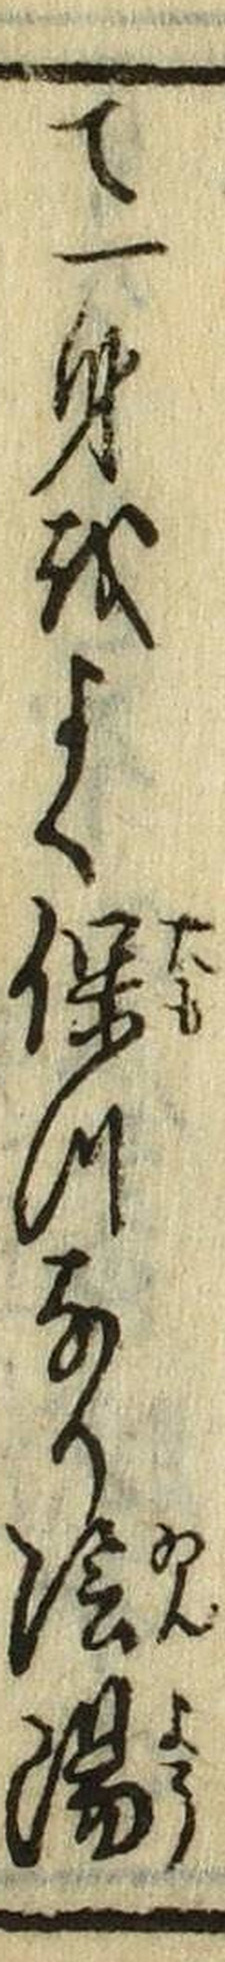て一身をよく保つなり陰陽
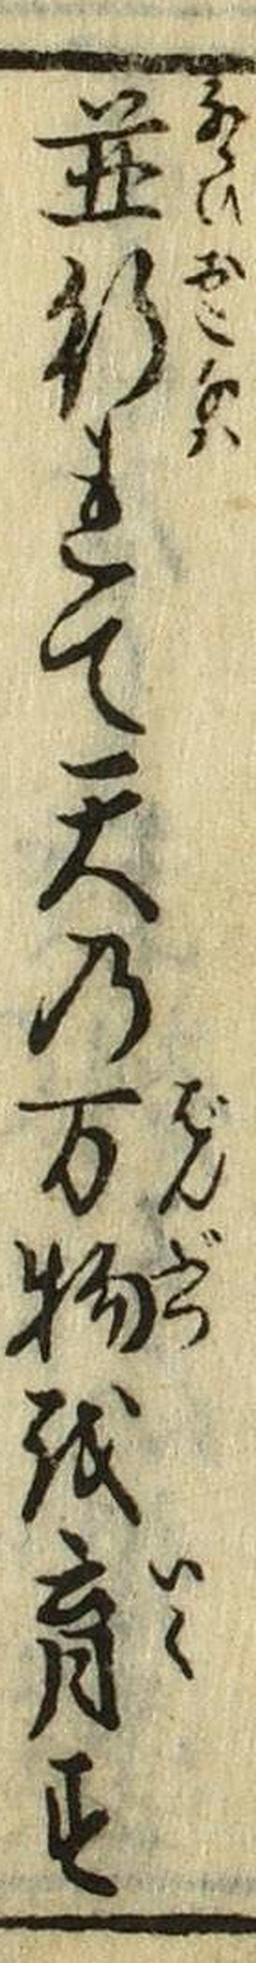並行れて天の万物を育す
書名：居家養生記
